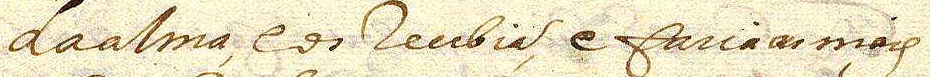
da alma, e os Recebia, e fazia as mais
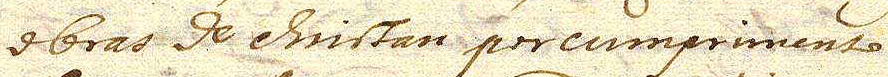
obras de christan por cumprimento
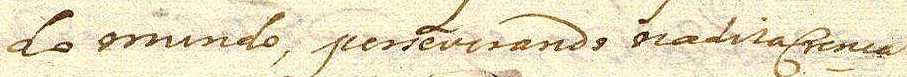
do mundo, perseverando na dita Crença
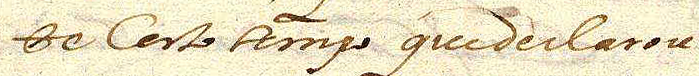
te Certo tempo que declarou.
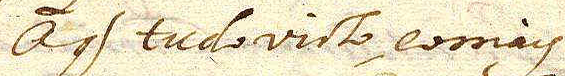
O q̄ tudo visto, e o mais
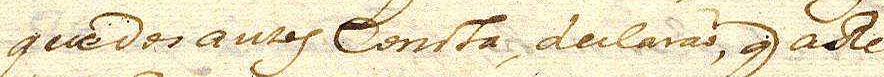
que dos autos Consta, declaraõ, q̄ a Re
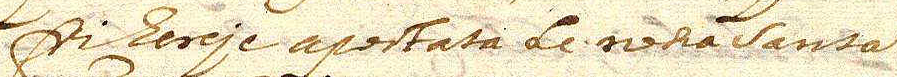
foi hereje apostata de nossa Santa
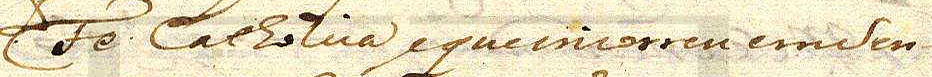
Fe Catholica, e que incorreu em Sen
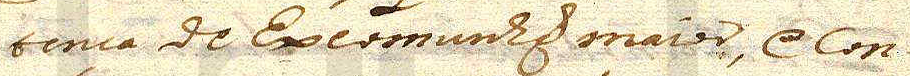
tença de Excomunhaõ maior, e con
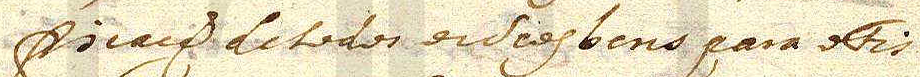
fiscaçaõ de todos os Seos bens para o Fis
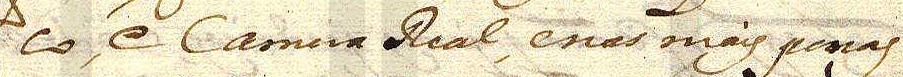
co, e Camera Real, e nas mais penas
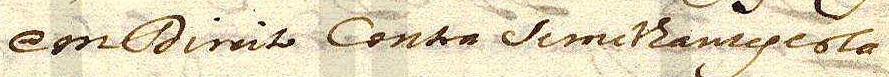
em Direito Contra Semelhantes esta
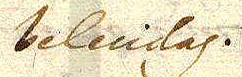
belecidas.
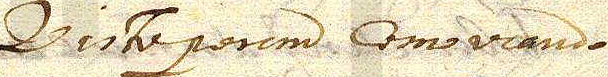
Visto porem Como vzando
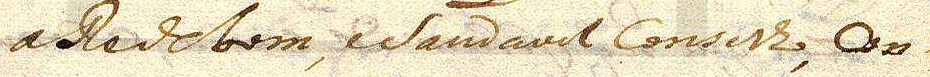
a Re de bom, e Saudavel Conselho, Con
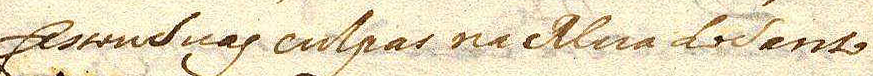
fessou Suas culpas na Meza do Santo
